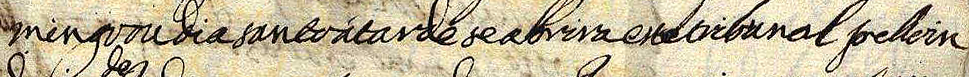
mingo ou dia santo á tarde se abrira este tribunal pello in
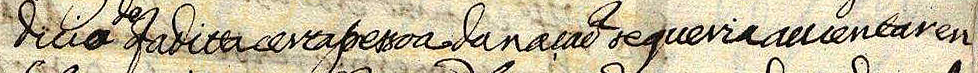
dicio de q̄ a ditta certa pessoa da naçaõ se queria aucentar en
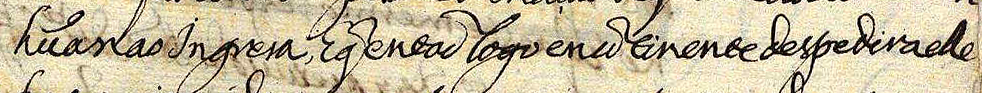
hūa nao Ingresa, E q̄ entaõ logo encōtinente despedira elle
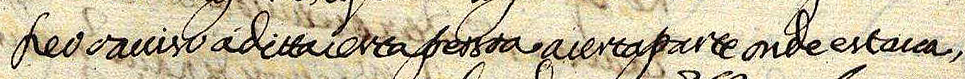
Reo o auizo á ditta certa pessoa a certa parte onde estaua,
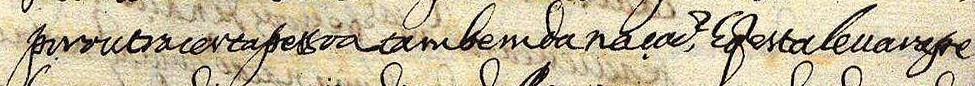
por outra certa pessoa tambem da naçaõ E q̄ esta leuara pe
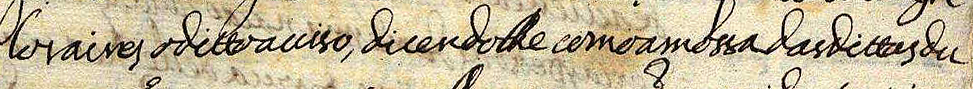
los aires o ditto auiso, dicendolhe como a mossa das dittas du
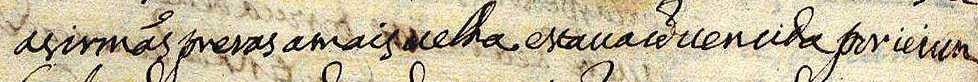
as irmās presas a mais uelha estaua cōuencida por ieiun
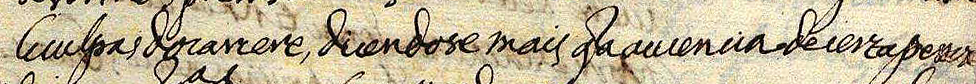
E culpas do carcere, dicendose mais q̄ a ausencia de certa pessoa
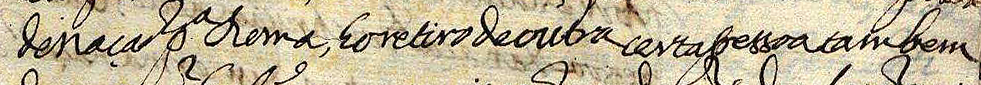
de naçaõ pa Roma, E o retiro de outra certa pessoa tambem
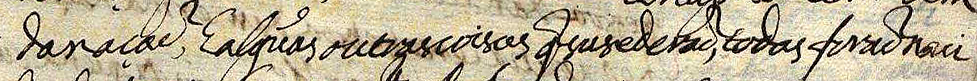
da naçaõ, E algūas outras coisas q̄ susederaõ, todas foraõ naci
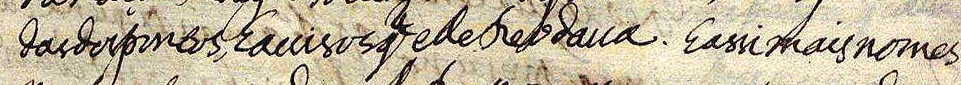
das dos pontos, E auisos q̄ elle Reo daua. E assi mais no mes
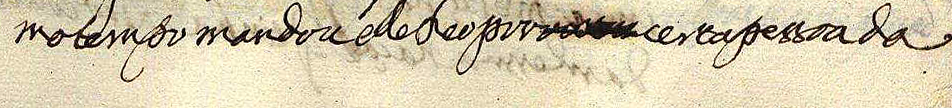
mo tempo mandou elle Reo por outra certa pessoa da
